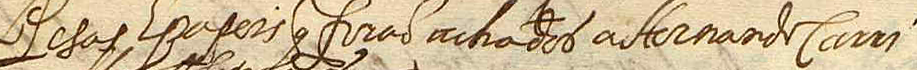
Pesas E papeis q̄ foraõ achados a Hernando Carri
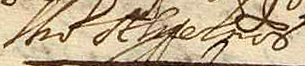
lho Aluernos
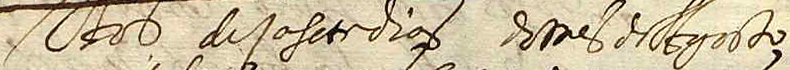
Aos dezasete dias do mes de Agosto
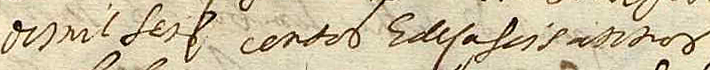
de mil seiscentos E dezaseis annos
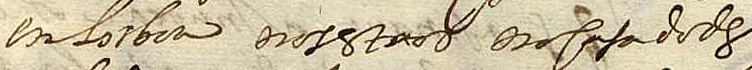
en Lisboa nos estaos na Casa do des
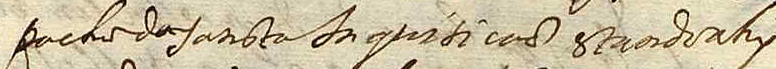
pacho da sancta Inquisiçaõ estando ahy
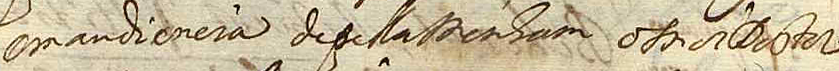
em audiencia de pella menham o snor Doctor
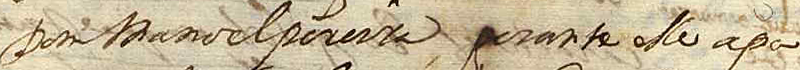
Dom Manoel pereira, perante elle apa
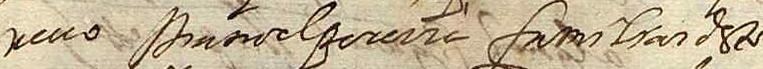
receo Manoel pereira familiar deste
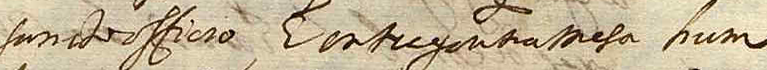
sancto officio E entregou na mesa hum
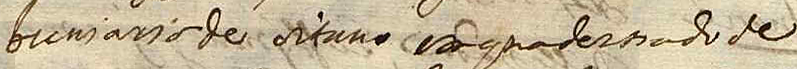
breuiario de oitauo emquadernado de
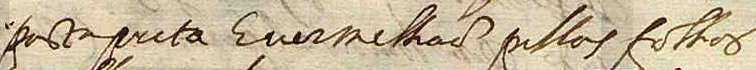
pasta preta E uermelhaõ pellas folhas
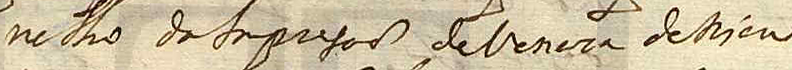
uelho da Impresaõ de Veneza de Nicu
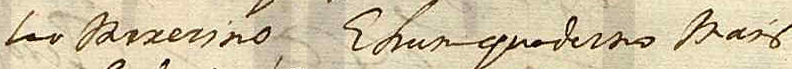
lao Mererino, E hum quaderno mais
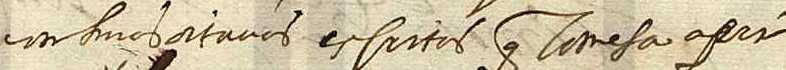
con huās oitauas esCritas q̄ Comesa a pri
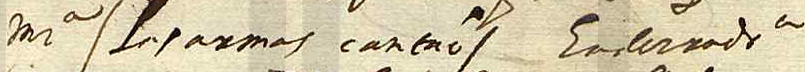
mra / Las armas cantaõ / E a derradra
